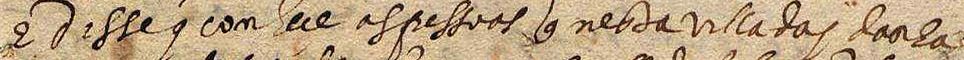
E disse q̄ conheçe as pessoas q̄ nesta villa da jdanha
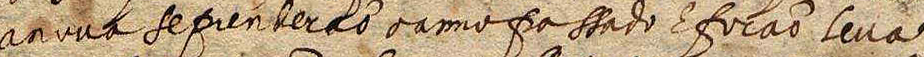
a noua se prenderaõ o anno passado E foraõ leua
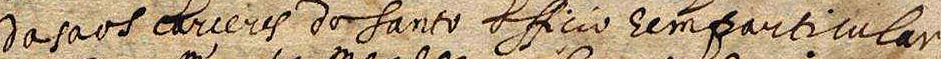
das aos carçeres do santo offiçio E em particular
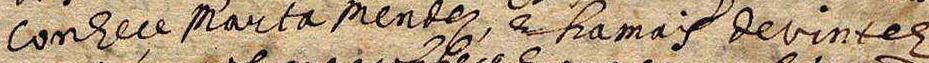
conheçe Marta Mendez, E ha mais de vinte E
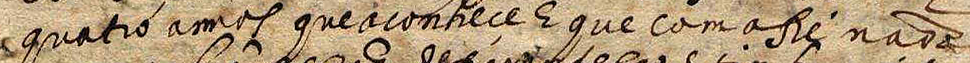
quatro annos que a conheçe E que com a Ré naõ
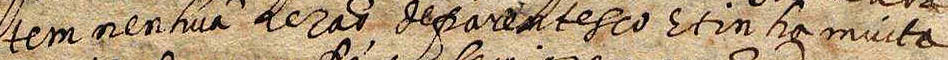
tem nenhuā rezaõ de parentesco E tinha muita
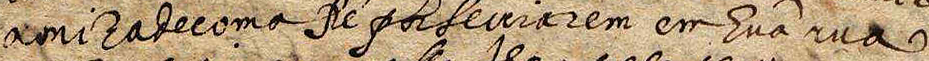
amizade com a Ré por se criarem em huā rua
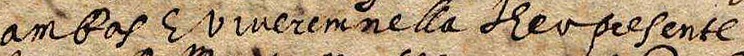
ambas E viuerem nella the o presente
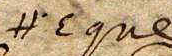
E que
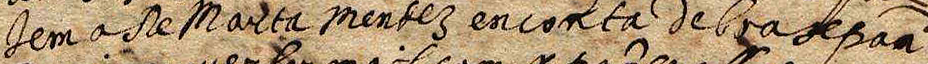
tem a Re Marta Mendez en conta de boa xpaã
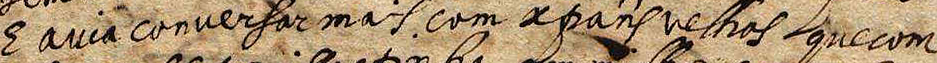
E a uia conuersar mais com xpan̄s velhas que com
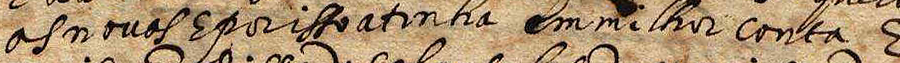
as nouas E por isso a tinha em milhor conta E
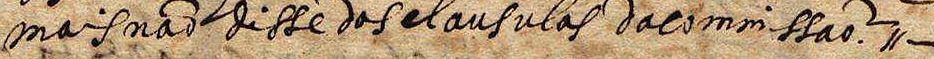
mais não disse das clausulas da commissaõ. // -
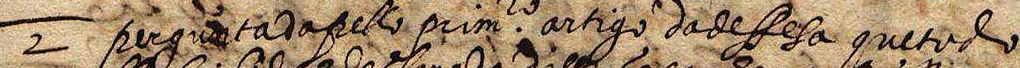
item perguntada pello prim.ro artigo da deffesa que todo
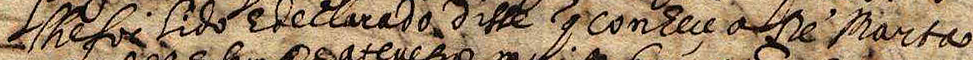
lhe foi Lido E declarado disse q̄ conheçe a Ré Marta
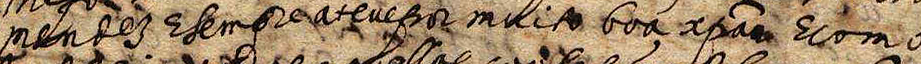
mendez E sempre a teue por muito boa xpãa E como
